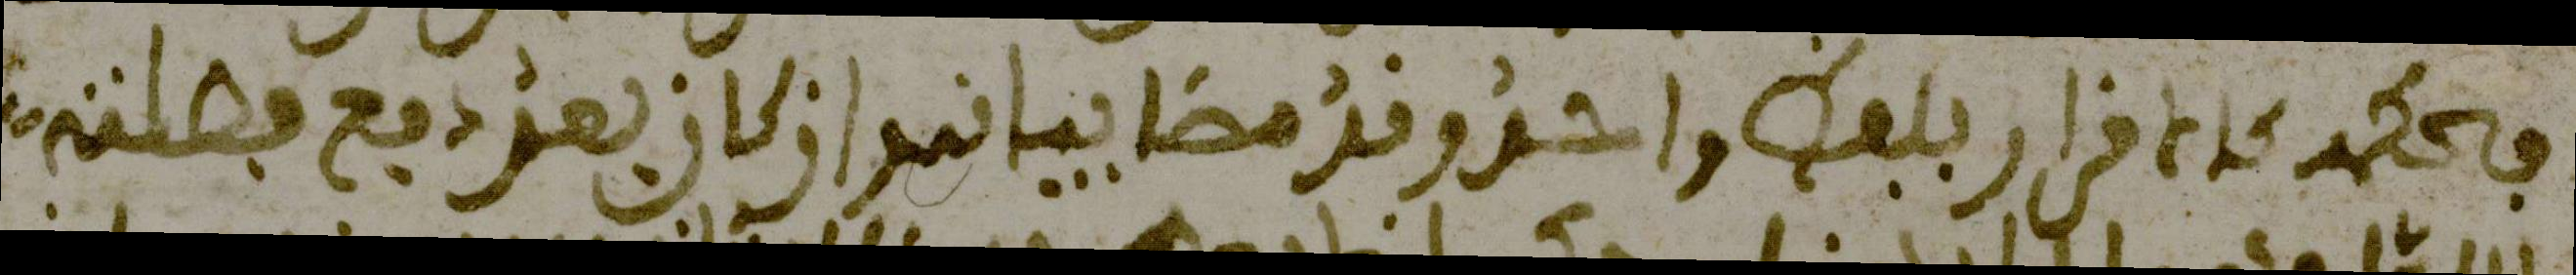فحكمه كالاقرار بلفظ واحد ووقد مضا بيانه وان كان بعد دفع فصلته
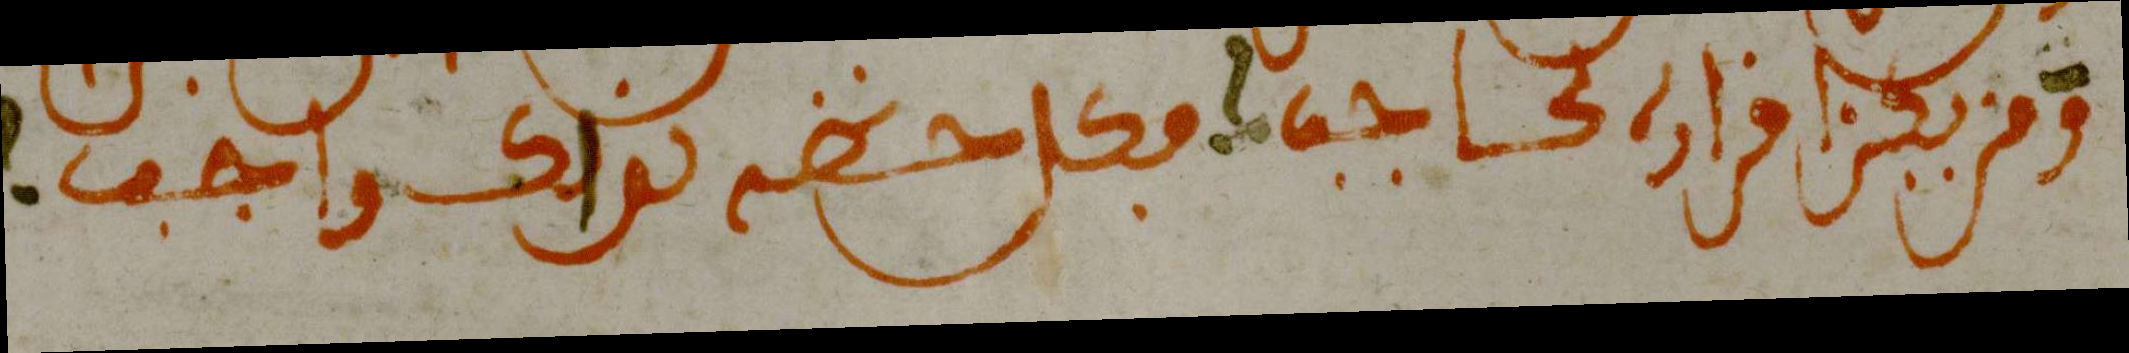وَمن يكن اقراره بحاجب فكل حظه لذاك واجب
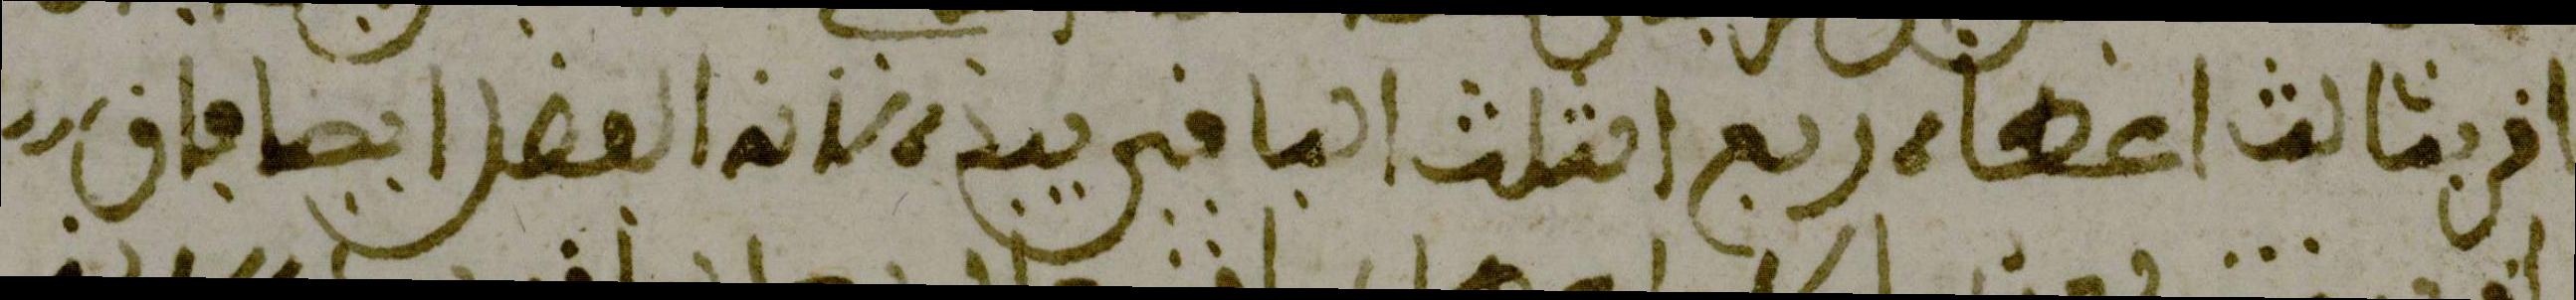اقرر بثالث اعطه ربع الثلث الباقي بيده لانه الفضل ايضا فان
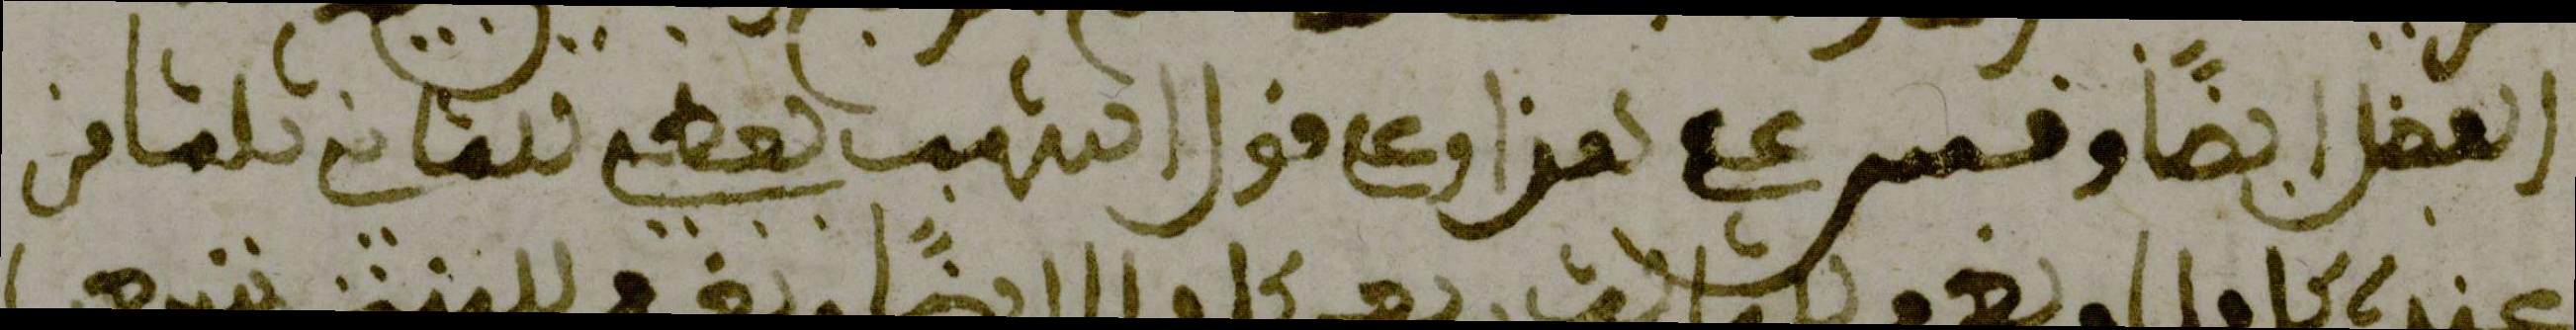الفضل ايضًا وقس على هذا وعلى قول اشهب يعطي للثاني ثلثا من
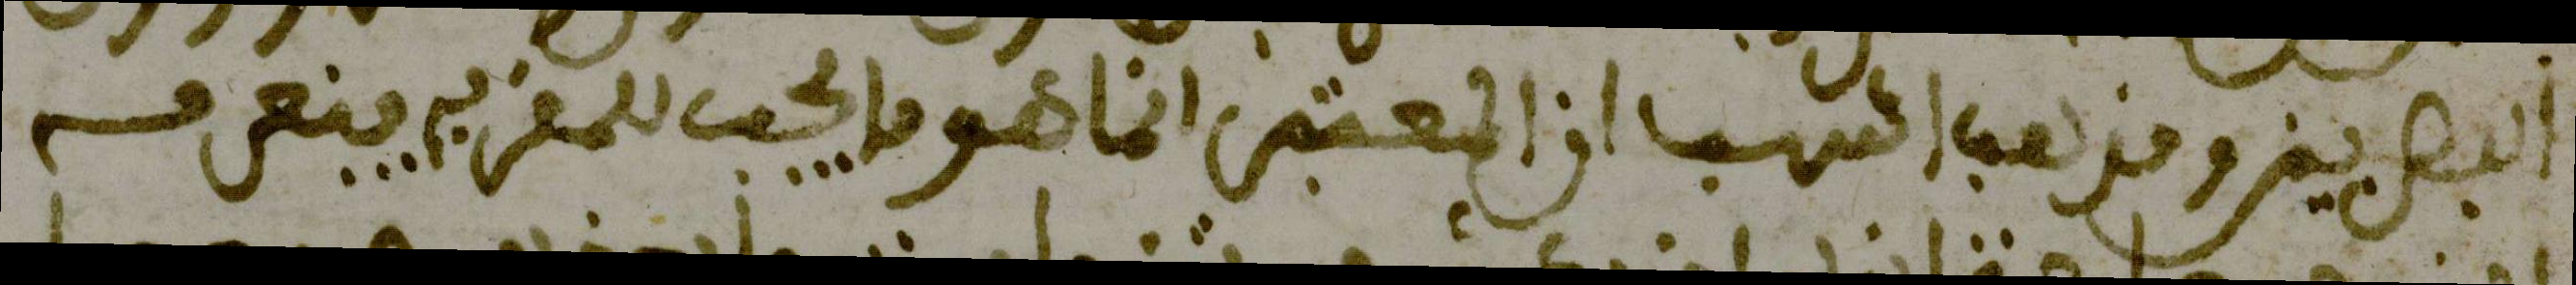البصريين ومذهب اشهب ان المعتبر انما هو ما يجب للمقر به فيغرمه
